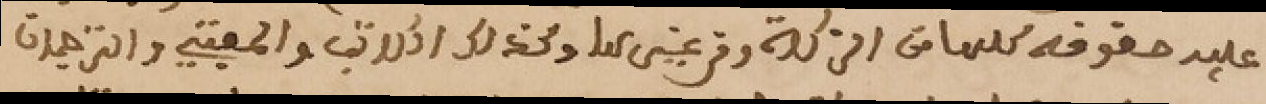عليه حقوقه كلها من الزكاة ومن غيرها وكذلك الكاتب والمقيم والترجمان
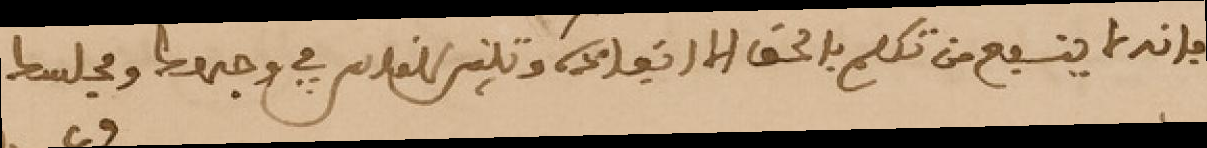فانه لا ينفع من تكلم بالحق الا اتقاذه وتبين للناس في وجهك ومجلسك #
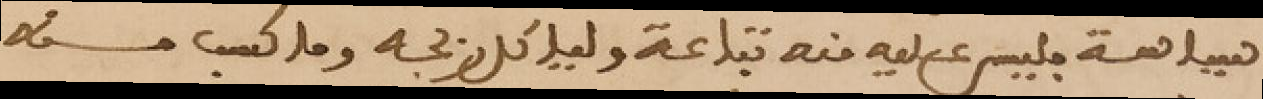سياسة فليس عليه منه تباعة ولياكل ربحه وما كسب منه
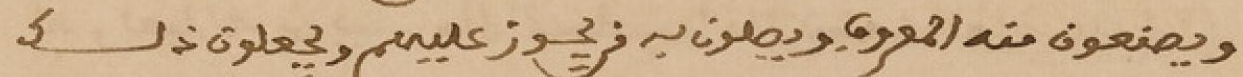ويصنعون منه المعروف ويصلون به من يجوز عليهم ويجعلون ذلك
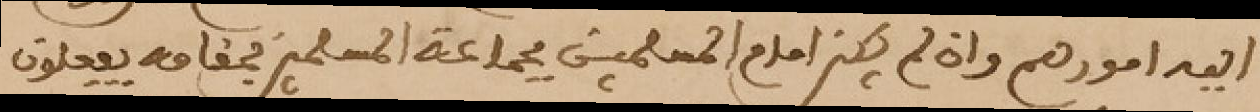اليه امورهم وان لم يكن امام المسلمين فجماعة المسلمين بمقامه يفعلون
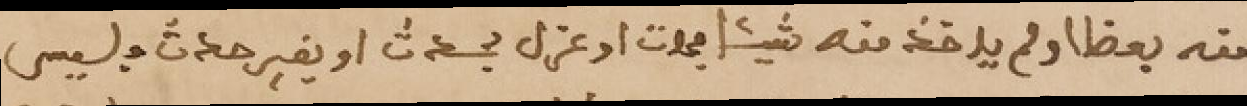منه بعضا ولم ياخذ منه شيئا فمات او عزل بحدث او بغير حدث فليس
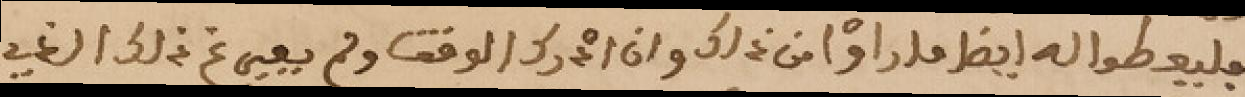فليعطوا له ايضا ما راوا من ذلك وان ادرك الوقت ولم يفرغ ذلك القيد
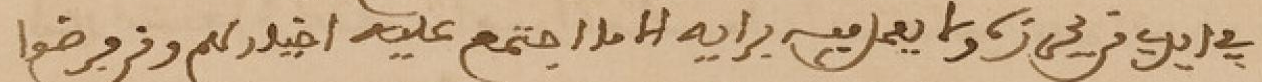في ايدي من يحرزه ولا يعمل فيه برايه لا ما اجتمع عليه اخيارهم ومن فرضوا
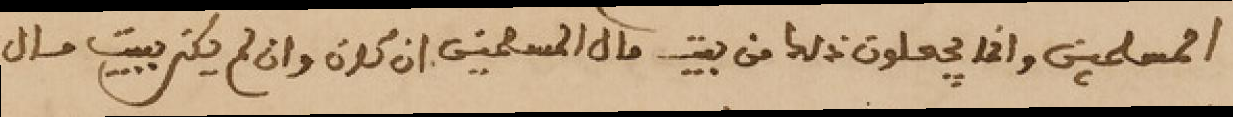المسلمين وانما يجعلون ذلك من بيت مال المسلمين ان كان وان لم يكن بيت مال
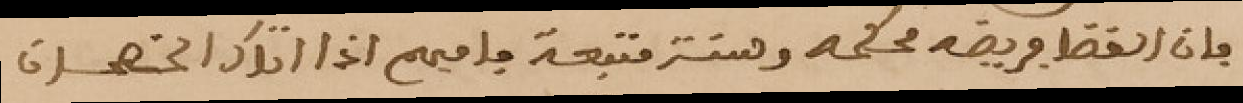فان القضا فريضه محكمه وسنة متبعة فايهم اذا اتاك
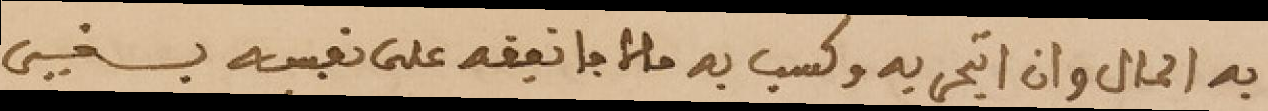به المال وان اتجر به وكسب به مالا فانفقه على نفسه بغير
